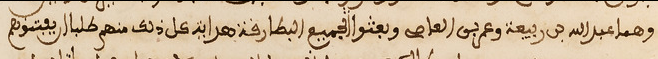وهما عبد الله بن ربيعة وعمر بن العاصى وبعثو الجميع البطارقة هراية كل ذلك منهم طلبا ان يفتنوهم
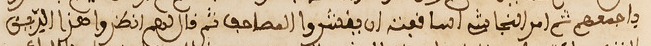باجمعهم ثم امر النجاشى اساقفته ان يقشروا المصاحف ثم قال لهم انظروا هذا الديق
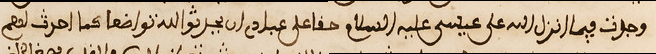وجدت فيما انزل الله على عيس عليه السلام حقا على عبادم ان بجرثو الله تواضعا كما احدث لهم
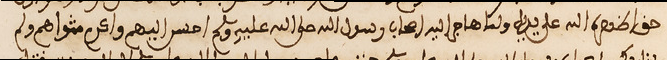حق اظهره الله على يديه ولما هاجر اليه اصحاب رسول الله صلى الله عليه وسلم احسن اليهم واكرم مثواهم ولم
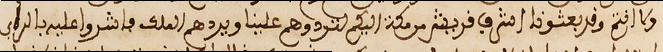ولا انتم وقد بعثونا اشرف قريش من مكة اليكم لتردوهم علينا ويردهم الملك فاشروا عليه بالرأي
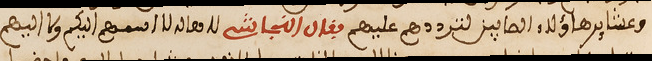وعشائر هاؤلاء الصابين لترددهم عليهم فقال النجاشى لا ماله لا اسمهم اليكم ولا اليهم
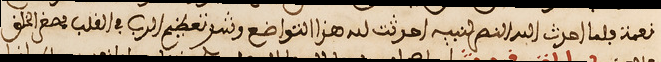نعمة فلما احدث الله النصر لنبيه احدثت لله هذا التواضع وشر تعظيم الرب في الغلب بصغر الخلق
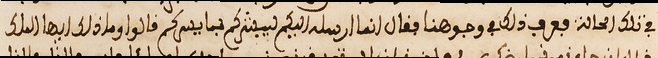في تلك الحالة فعرف ذلك في وجوهنا فقال انما ارسله اليكم ليبشركم بما يسركم قالوا وما ذلك ايها الملك
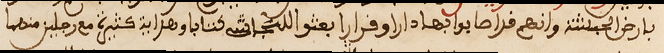بارض الحبشة وانهم قد اصابوا بها دار او قرارا بعثو اللصجاشى كتابا وهراية كثيرة مع رجلين منهما
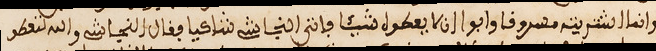وانما اشتريته مسروقا وابوا ان لا يعطوه شيئا فاتى النجا شى شاكيا فقال النجاشى والله لتعطو
